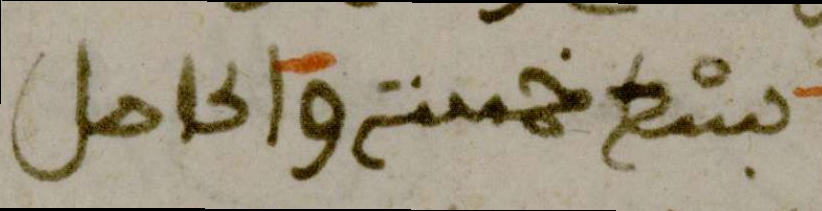بسط خمسة و الحاصل
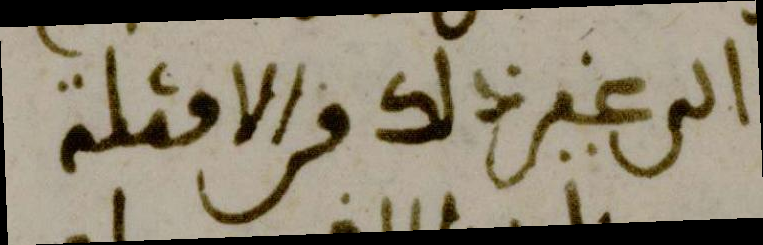الى غير ذلك من الامثلة
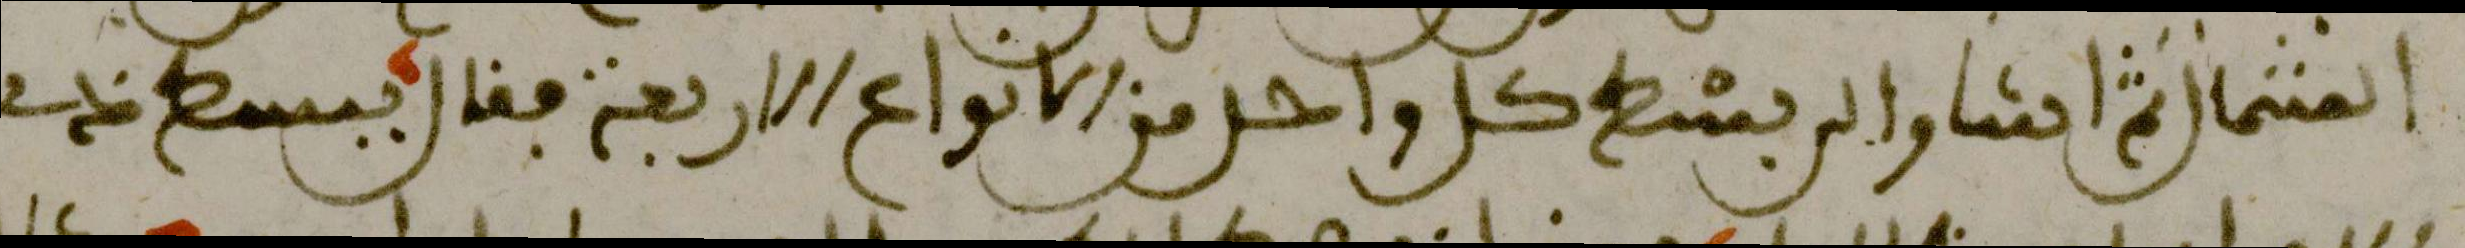الشمال ثم اشار الى بسط كل واحد من الانواع الاربعة فقال ببسط ذي
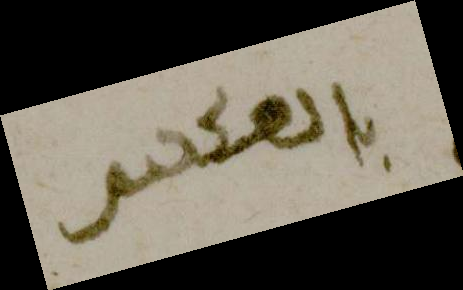بالعكس
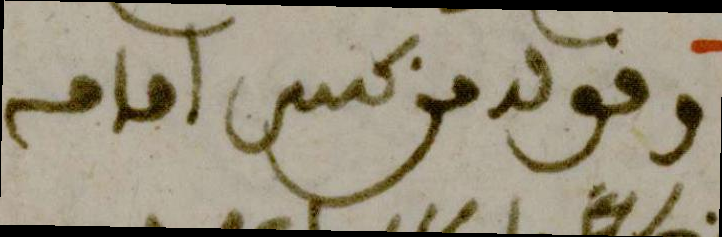و قوله من كسر امامه
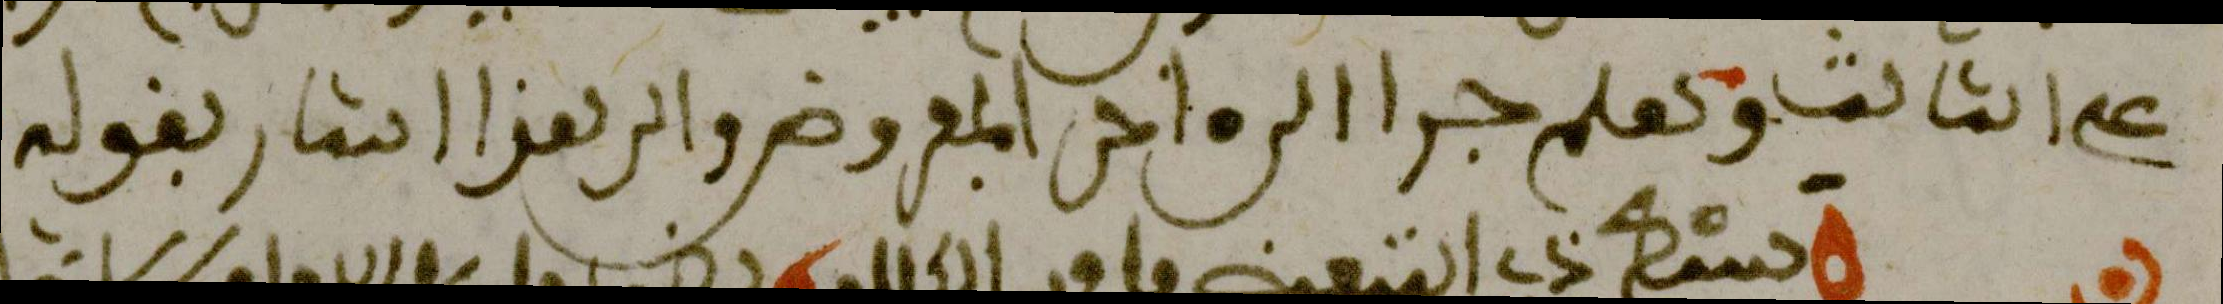على الثالث و هلم جرا الى ءاخر المفروض و الى هذا اشار بقوله
